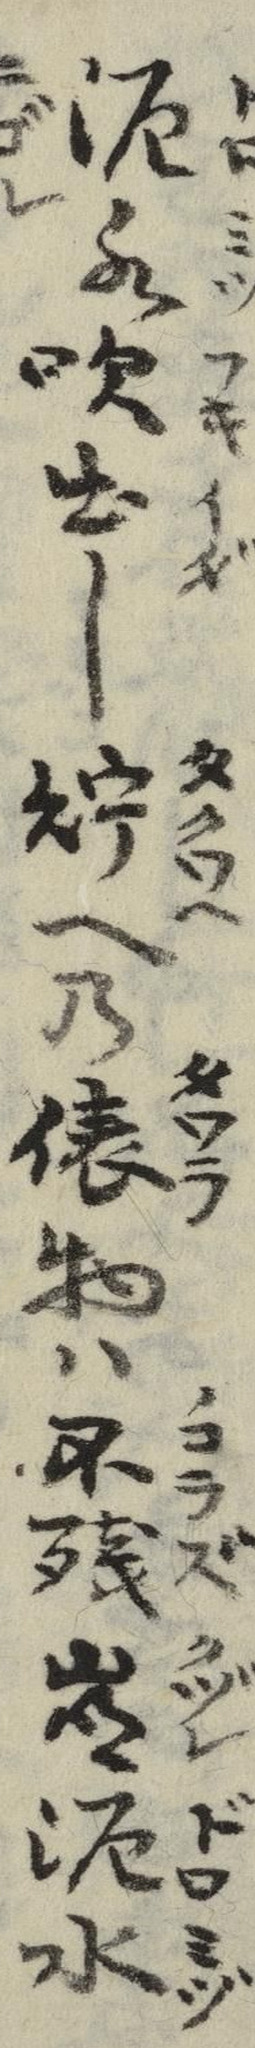泥水吹出し貯へ乃俵物ハ不残崩泥水
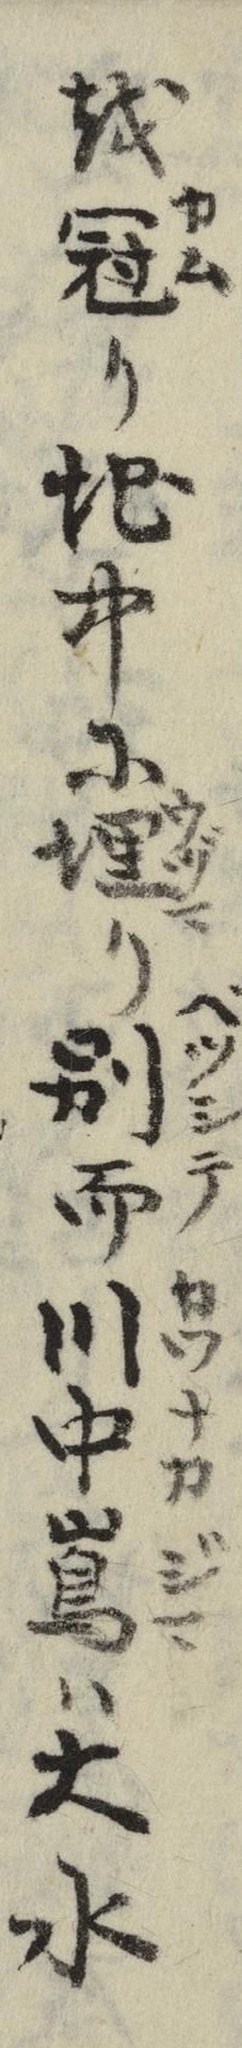を冠り地中に埋り別而川中嶌ハ大水
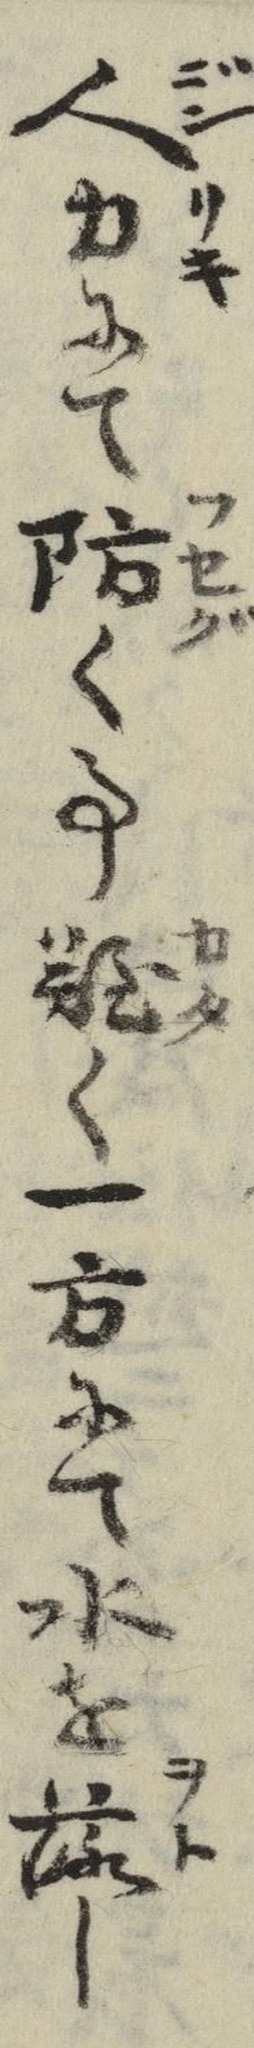人力にて防く事難く一方にて水を落し
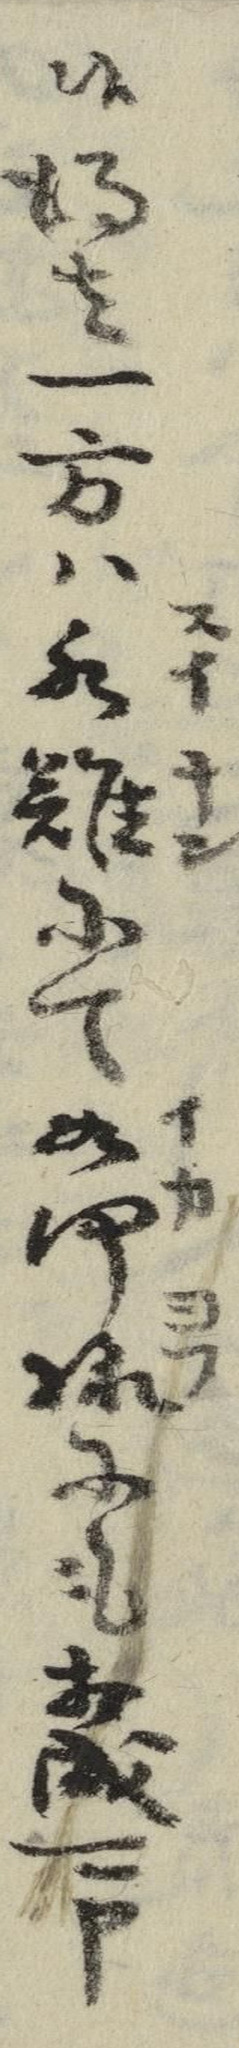候得は一方ハ水難にて如何様にも相成可申
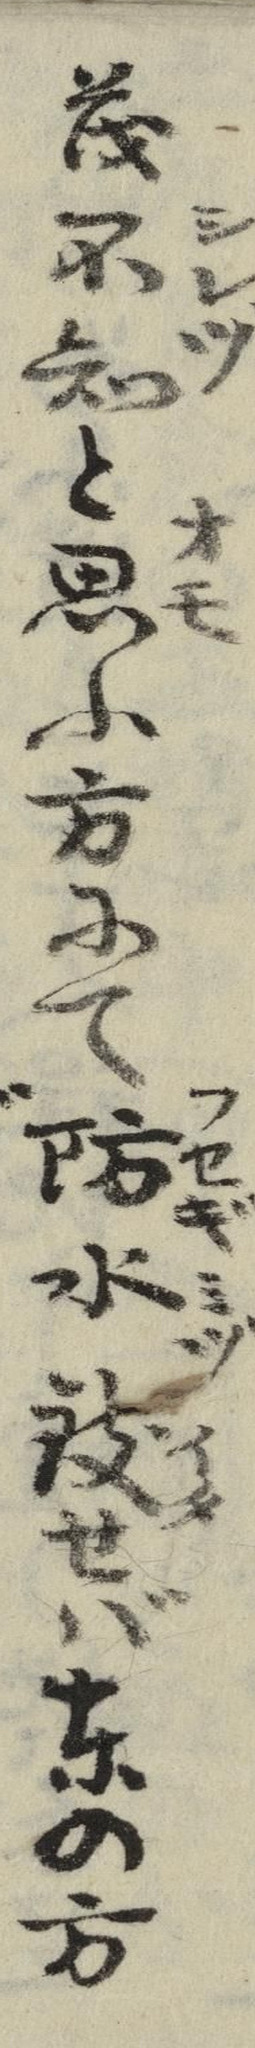も不知と思ふ方にて防水致せバ東の方
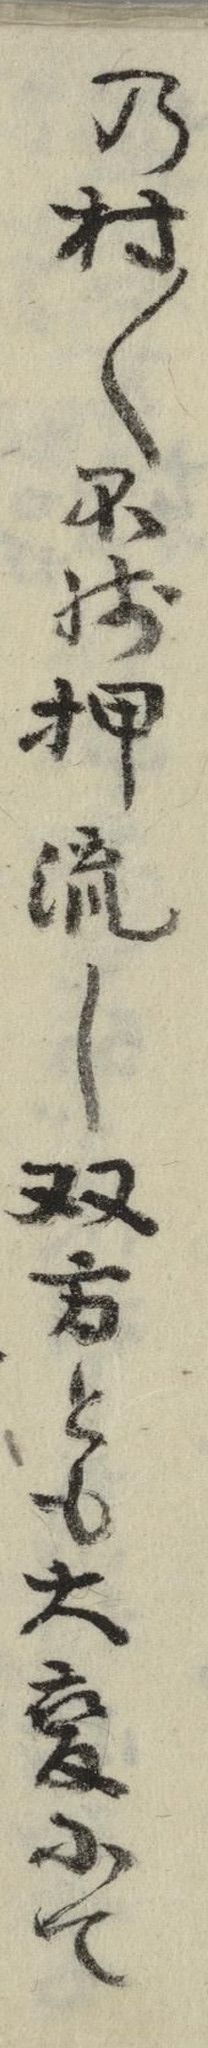乃村〳〵不残押流し双方とも大変にて
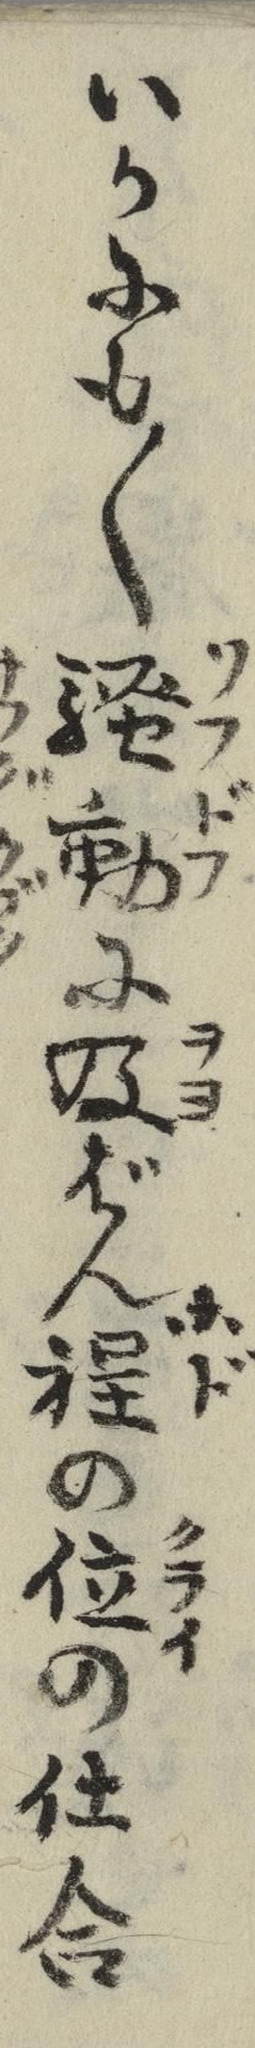いかにも〳〵騒動に及ばん程の位の仕合
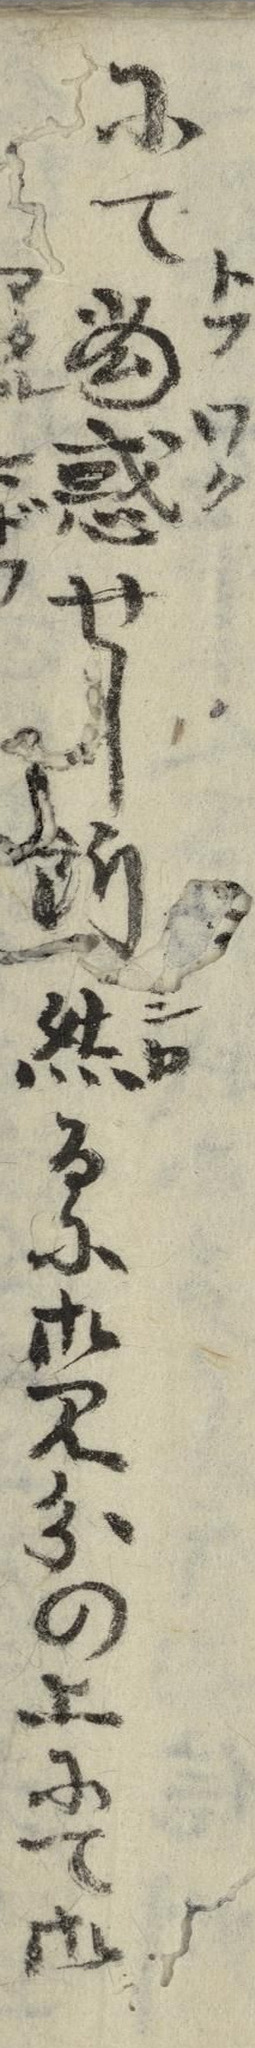にて当惑せし所然るに御見分の上にて御
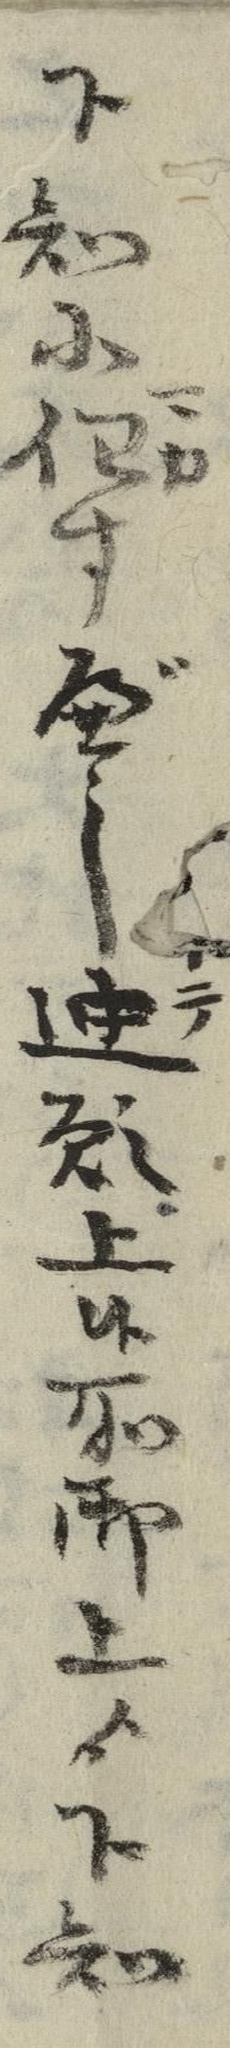下知に任すべし迚願上候所御上ゟ下知
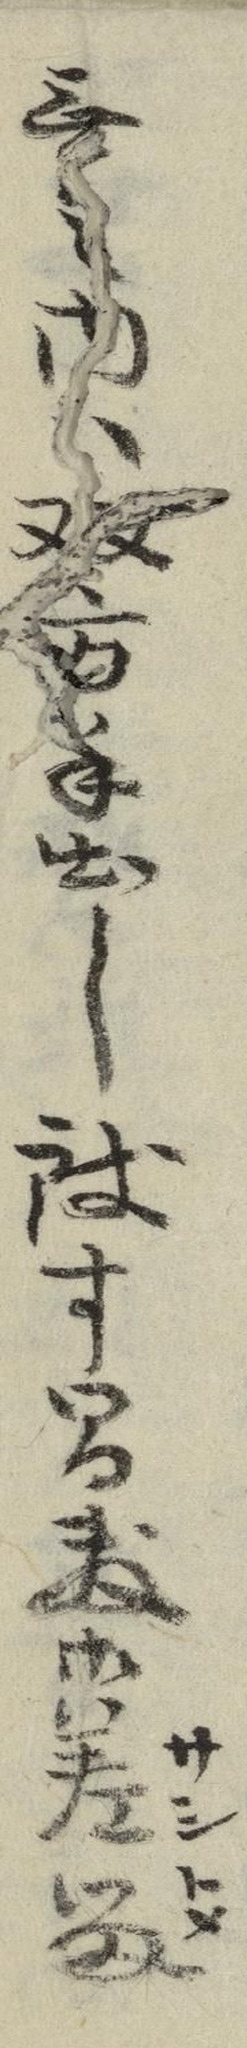無之内ハ双方手出し致す間敷御差留
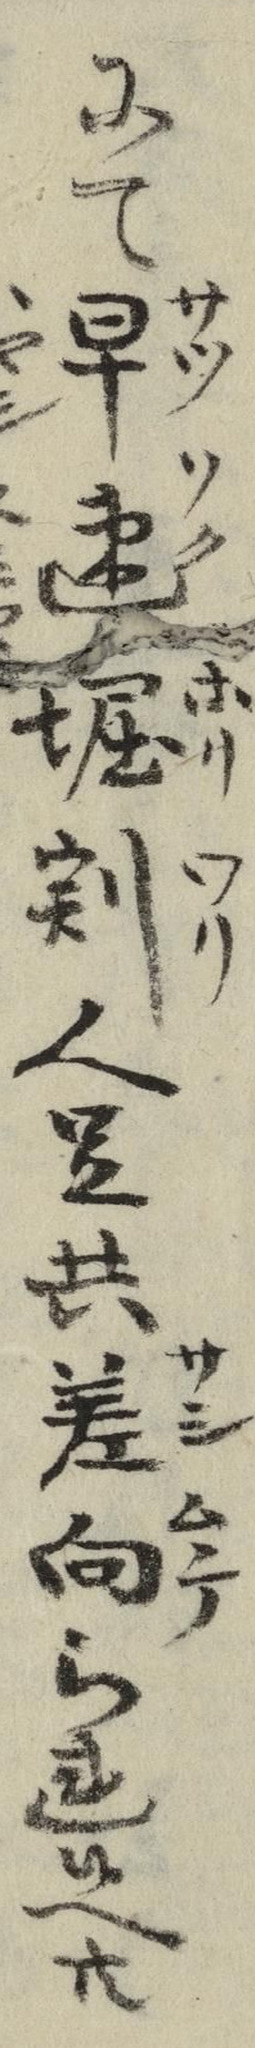にて早速堀割人足共差向られ候へ共
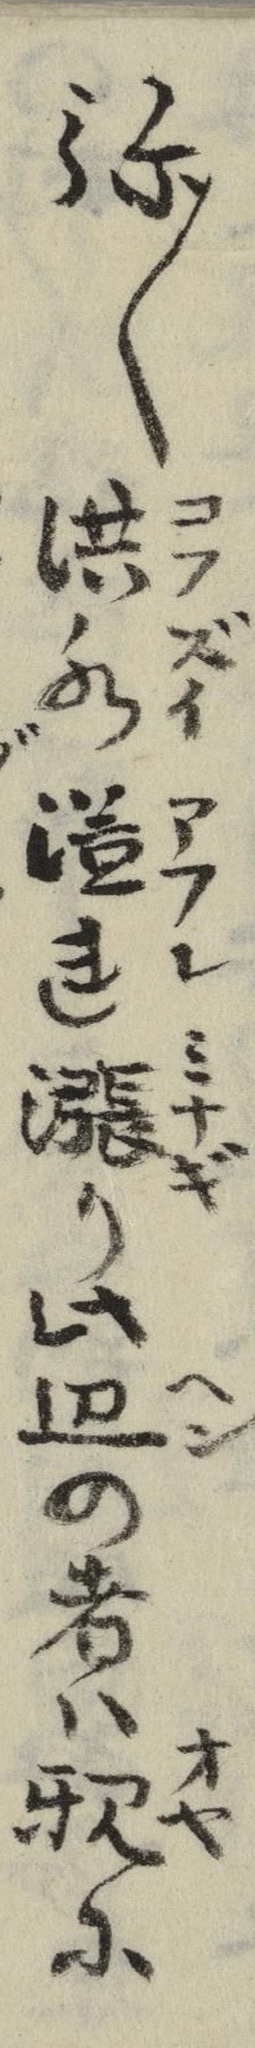弥〳〵洪水溢連漲り此辺の者ハ親に
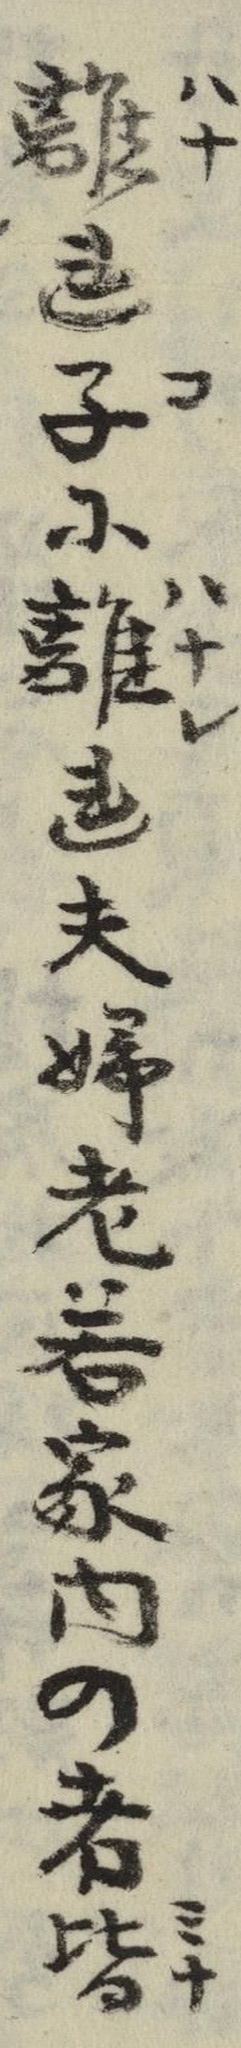離れ子に離連夫婦老若家内の者皆
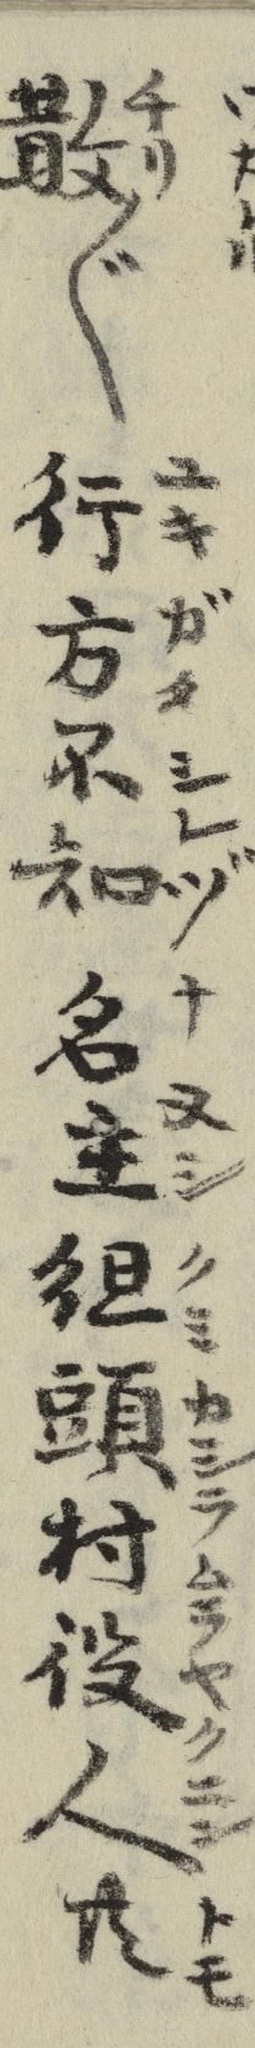散〴〵行方不知名主組頭村役人共
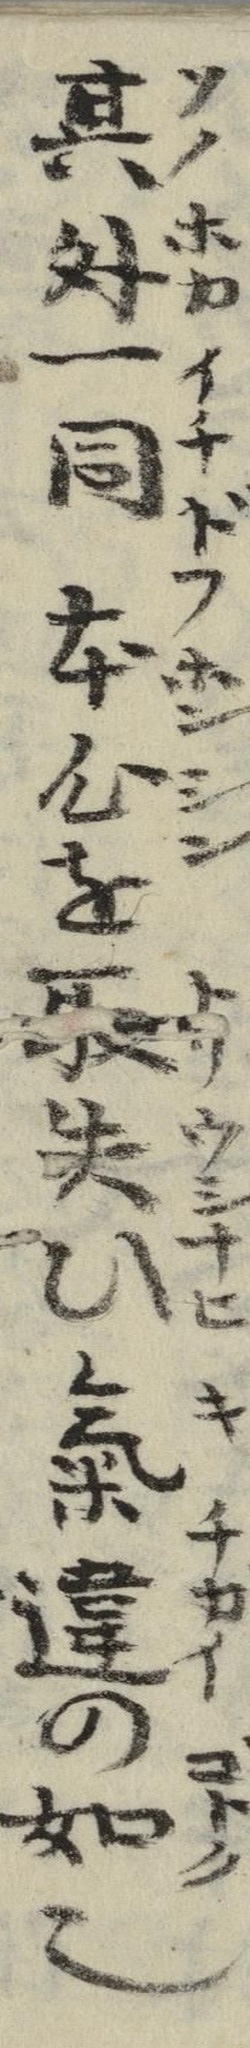其外一同本心を取失ひ気違の如也
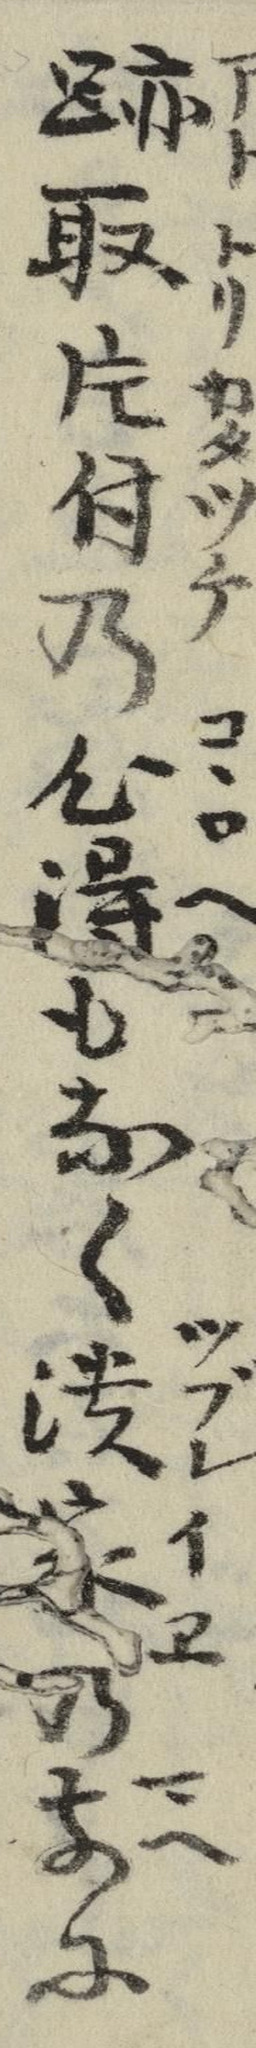跡取片付乃心得もなく潰家の前に
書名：信州大地震一件之冩　丁未弘化四年三月吉日
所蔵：東京大学地震研究所図書室 Earthquake Research Institute Library, The University of Tokyo, JAPAN
